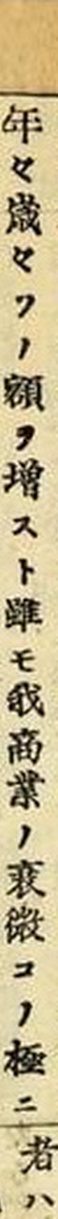年々歳々ソノ額ヲ増スト雖モ我商業ノ衰微コノ極ニ
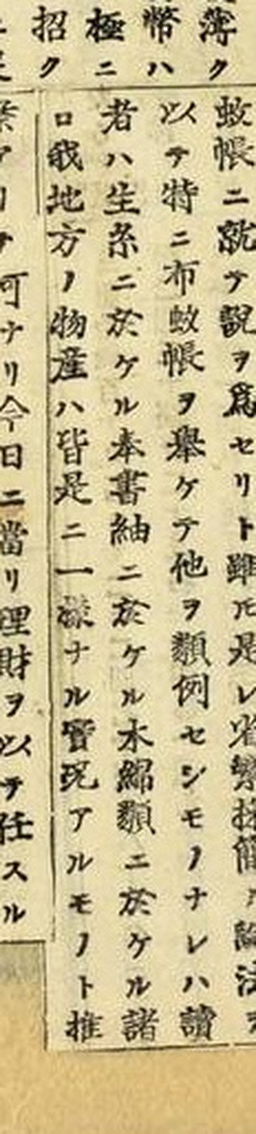者ハ生糸ニ於ケル奉書紬ニ於ケル木綿類ニ於ケル諸
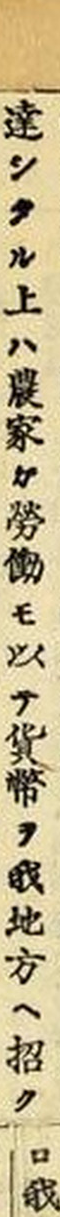達シタル上ハ農家ガ勞働モ以テ貨幣ヲ我地方ヘ招ク
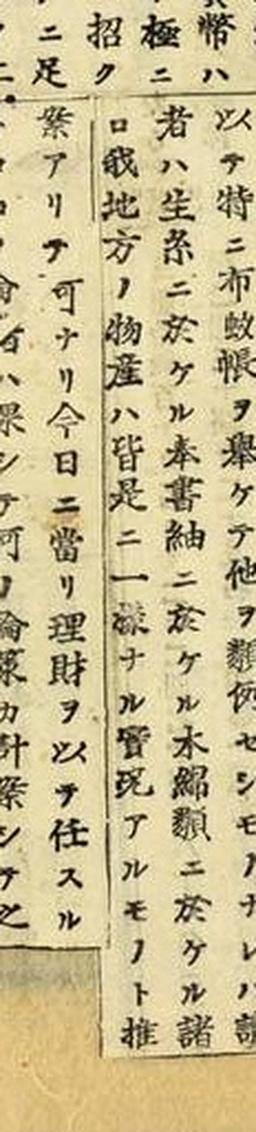ロ我地方ノ物産ハ皆是ニ一様ナル實况アルモノト推
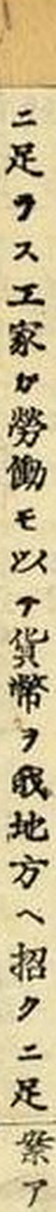ニ足ラス工家ガ勞働モ以テ貨幣ヲ我地方ヘ招クニ足
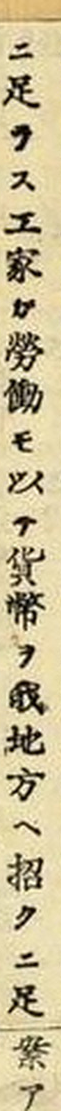ニ足ラス工家ガ勞働モ以テ貨幣ヲ我地方ヘ招クニ足
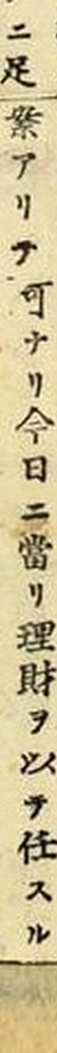案アリテ可ナリ今日ニ當リ理財ヲ以テ任スル
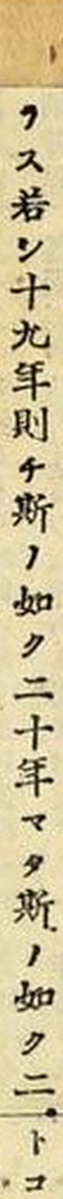ラス若シ十九年則チ斯ノ如ク二十年マタ斯ノ如クニ
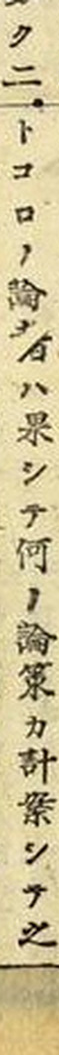トコロノ論者ハ果シテ何ノ論策カ計案シテ之
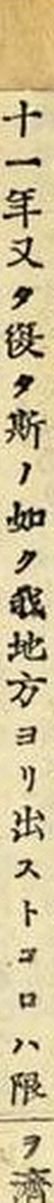十一年又タ復タ斯ノ如ク我地方ヨリ出ストコロハ限
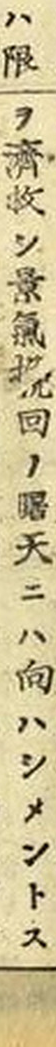ヲ濟救シ景氣挽回ノ曙天ニハ向ハシメントス
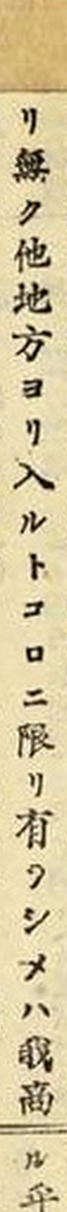リ無ク他地方ヨリ入ルトコロニ限リ有ラシメハ我商
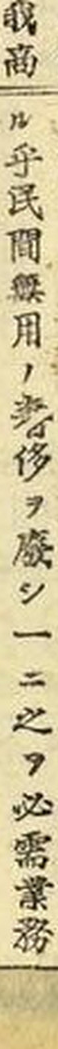ル乎民間無用ノ奢侈ヲ癈シ一ニ之ヲ必需業務
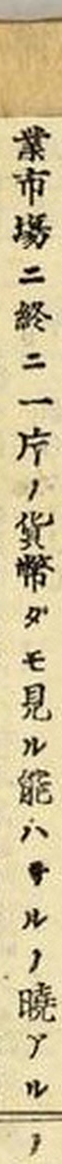業市塲ニ終ニ一片ノ貨幣ダモ見ル能ハサルノ曉アル
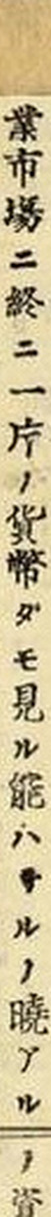業市塲ニ終ニ一片ノ貨幣ダモ見ル能ハサルノ曉アル
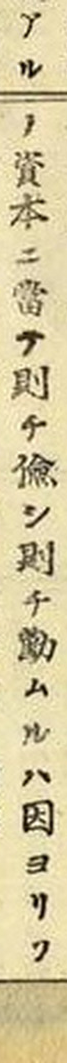ノ資本ニ當テ則チ儉シ則チ勤ムルハ因ヨリソ
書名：温古集 五巻
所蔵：福井県文書館 Fukui Prefectural Archives
